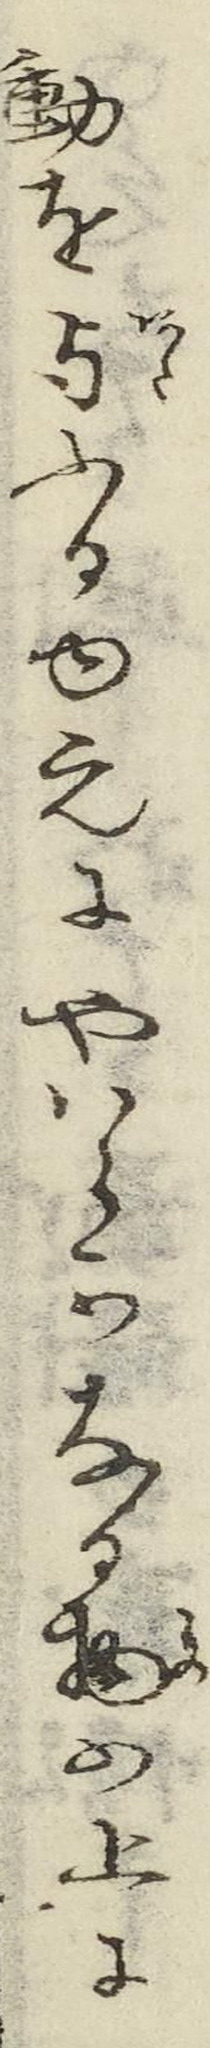動を与ふるゆえにやはらかなる物の上に
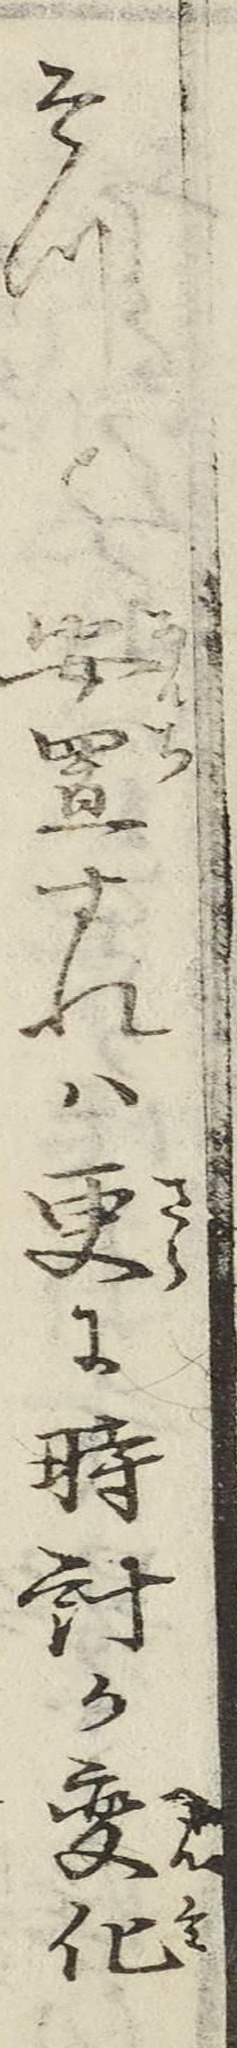そつと安置すれは更に時計か変化
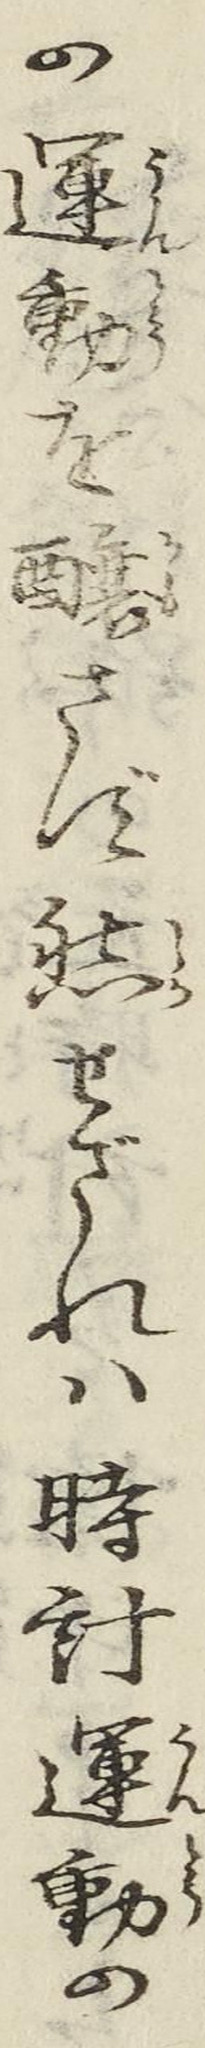の運動を醸さず然せざれは時計運動の
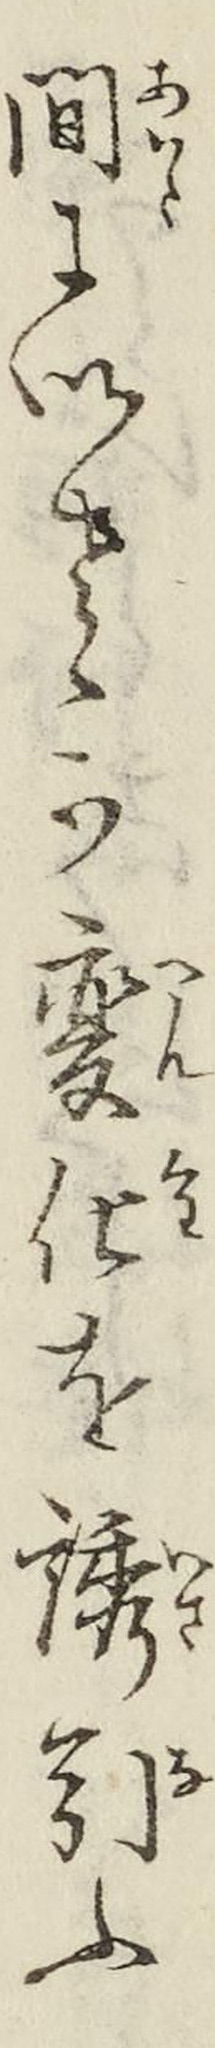間にいさゝか変化を誘引ふ
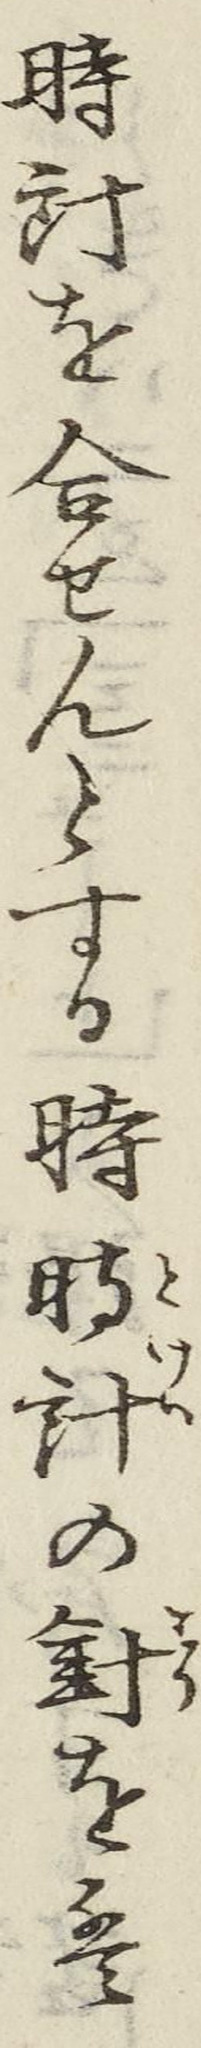時計を合せんとする時時計の針をは
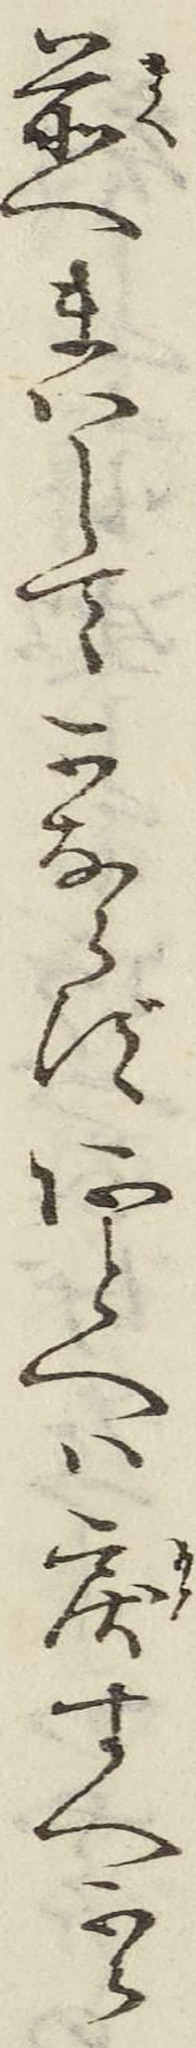前へまはしてかならずあとへは戻すへから
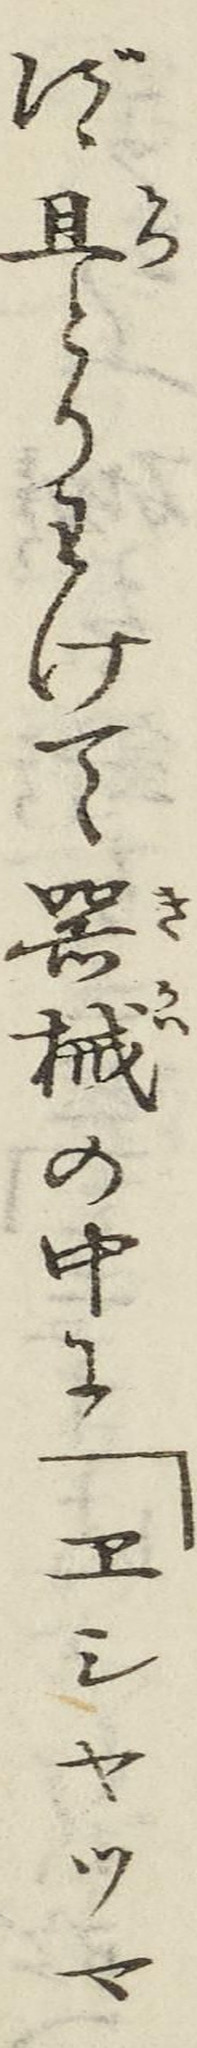ず且とりわけて器械の中に「ヱシヤツマ
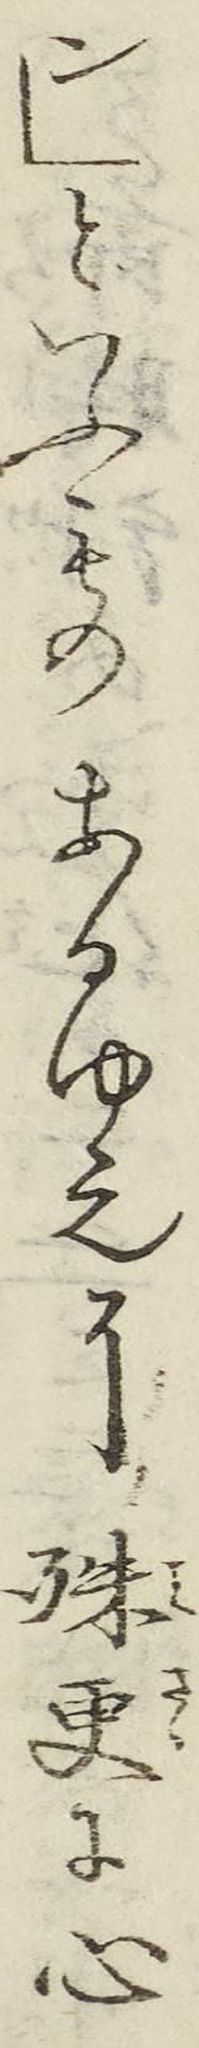ン」といふものあるゆえに殊更に心
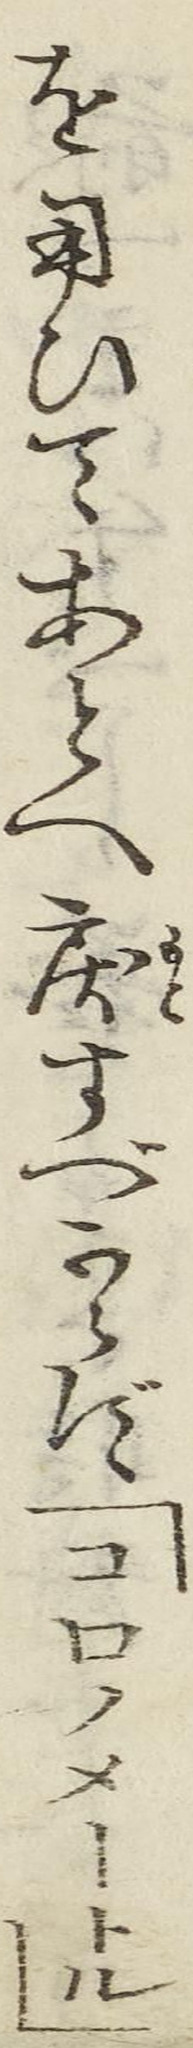を用ひてあとへ戻すべからず「コロノメートル」
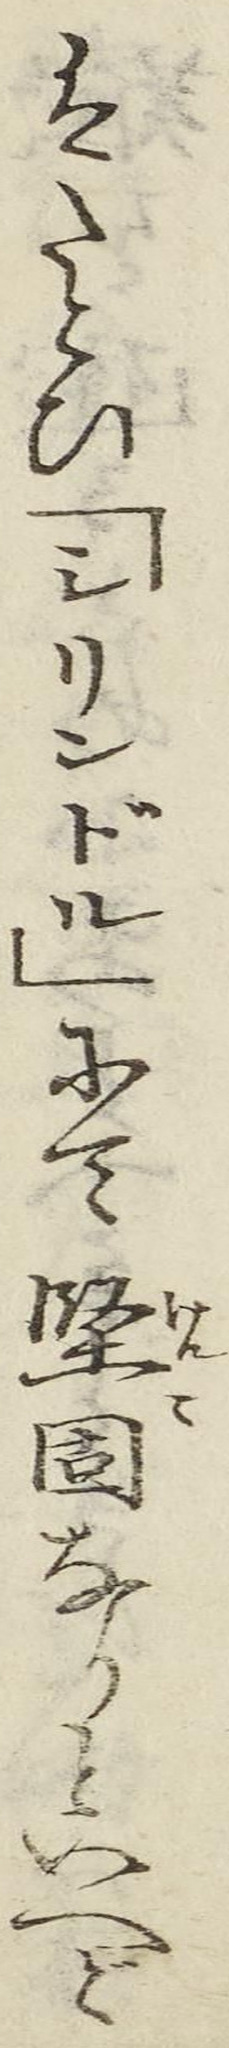はたとひ「シリンドル」にて堅固なりといへど
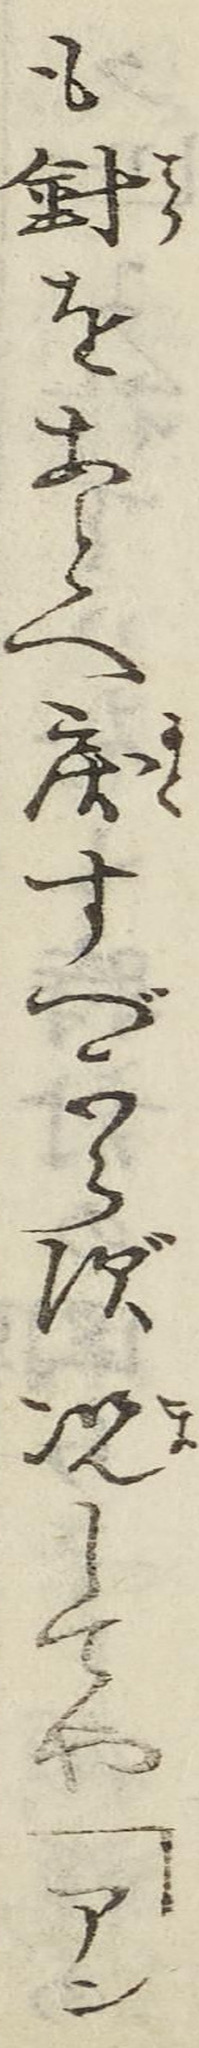も針をあとへ戻すべからず況してや「アン

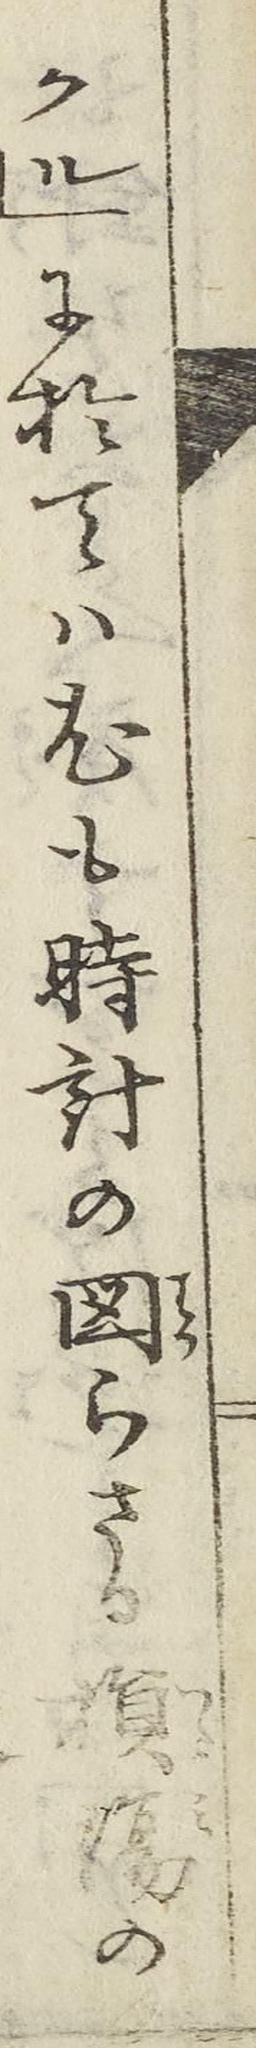クル」に於ては尤も時計の図らさる損傷の
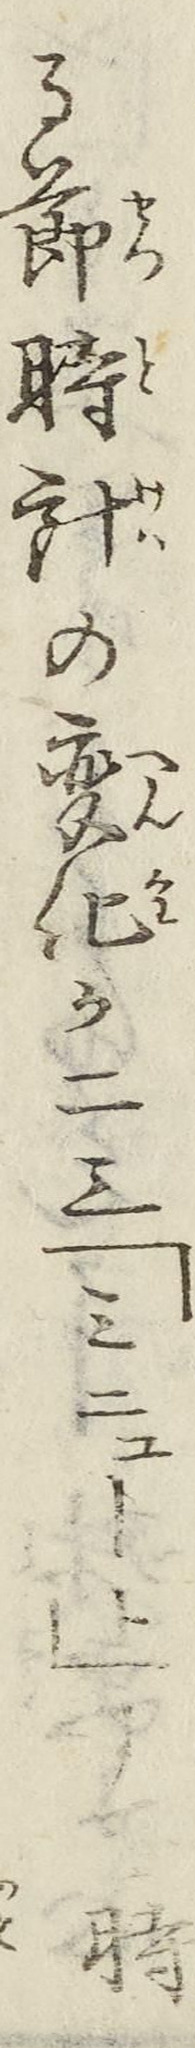る節時計の変化か二三「ミニュート」にて時
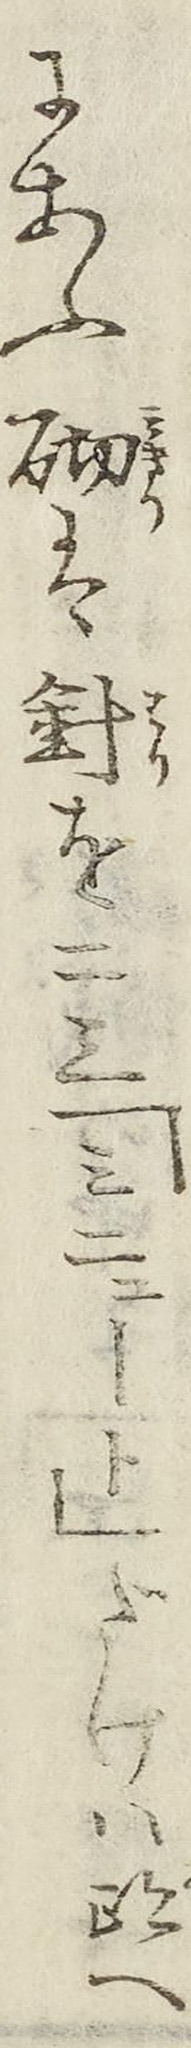にあふ砌は針を二三「ミニユート」だけは跡へ
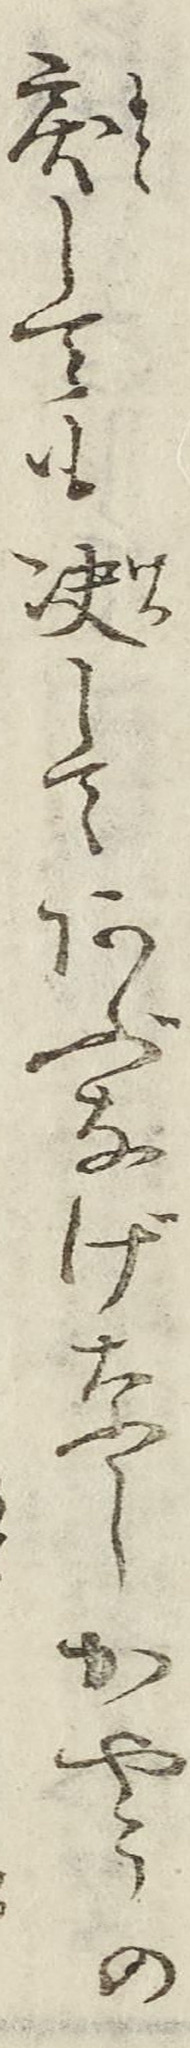戻しても決してあぶなげなしかやうの
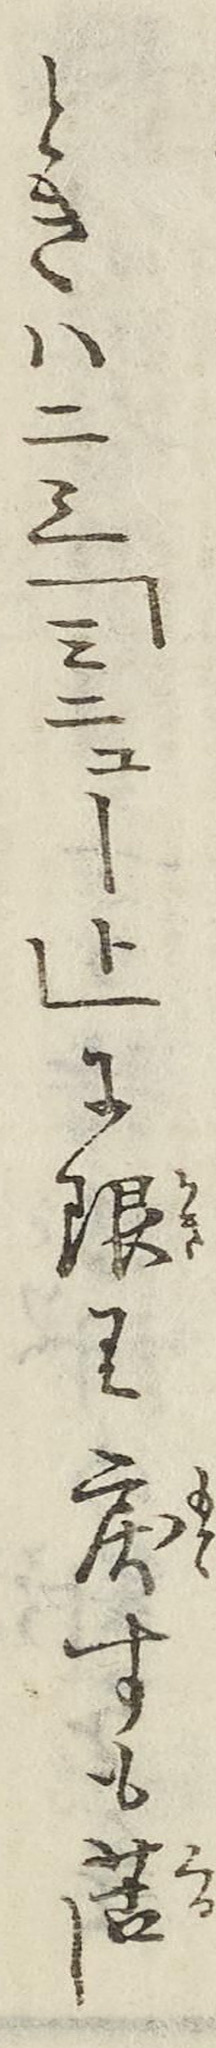ときは二三「ミニユート」に限り戻すも苦し
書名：[時計に関する冊子]
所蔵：東京大学地震研究所図書室 Earthquake Research Institute Library, The University of Tokyo, JAPAN
